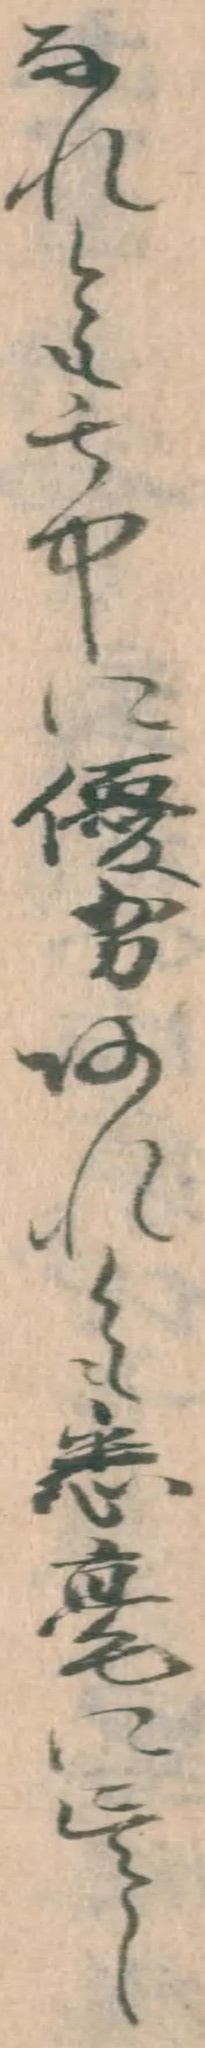なれとも其中に優劣あれとも悉毫に正とし
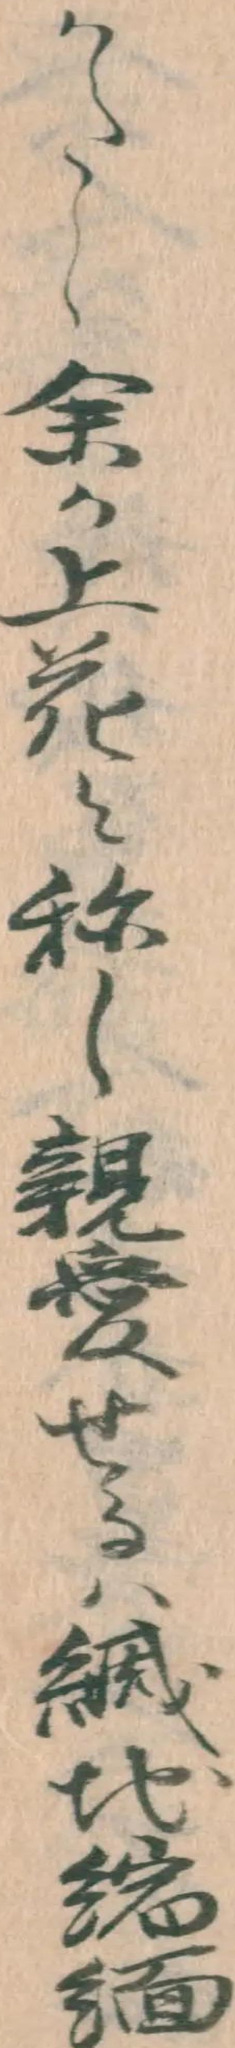かたし余の上花と称し親愛せるハ淑縬縮緬
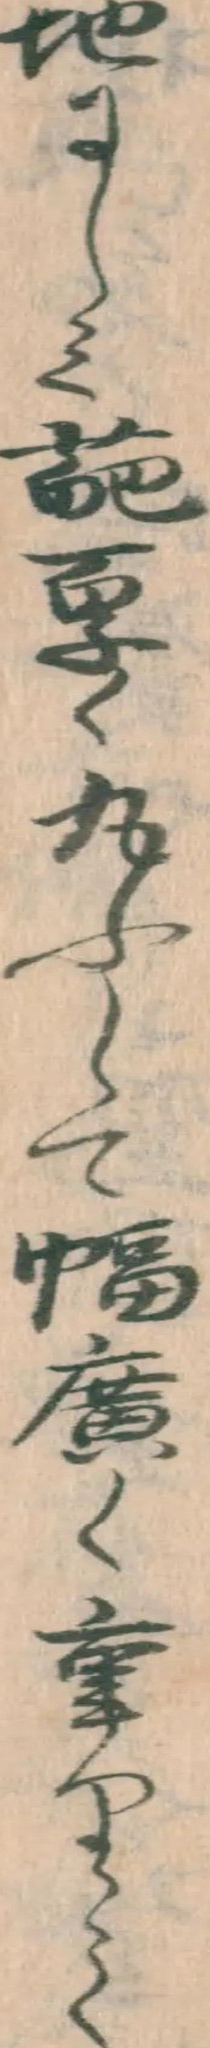地にして葩厚く丸にして幅広く重りて
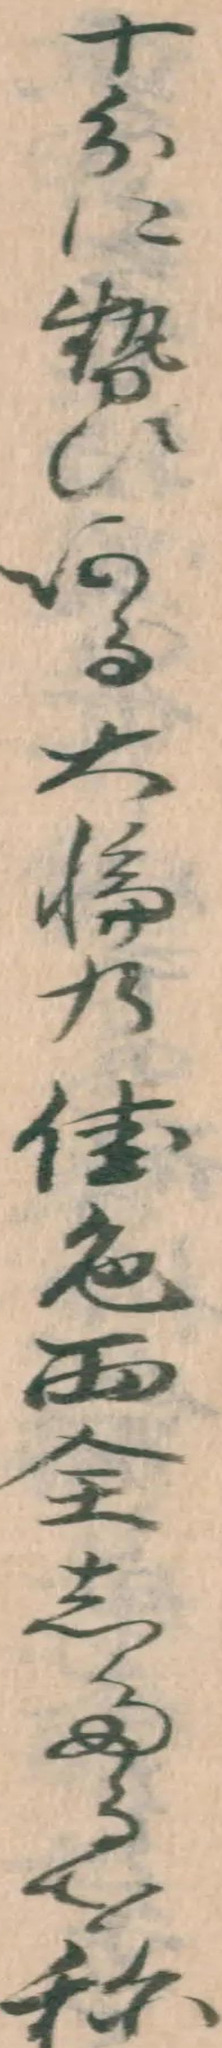十分に勢ひある大輪の佳色両全したるを称
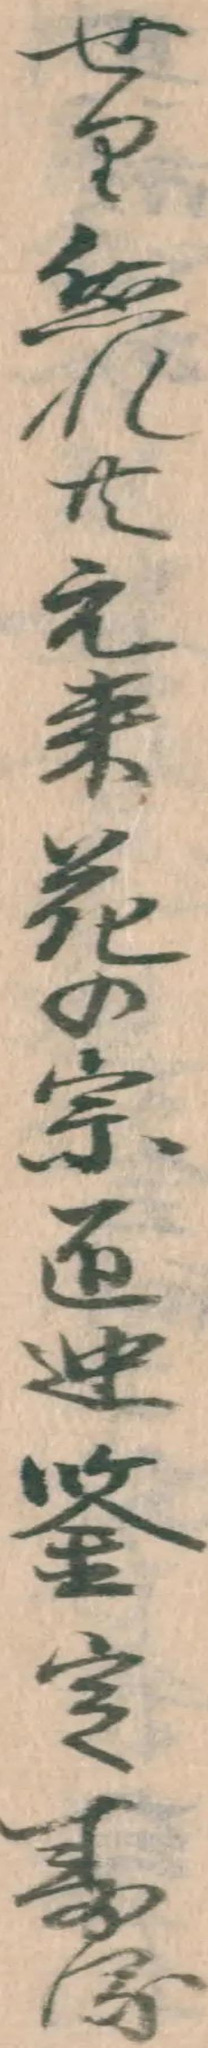せり然れ共元来花の宗近迚筌定する
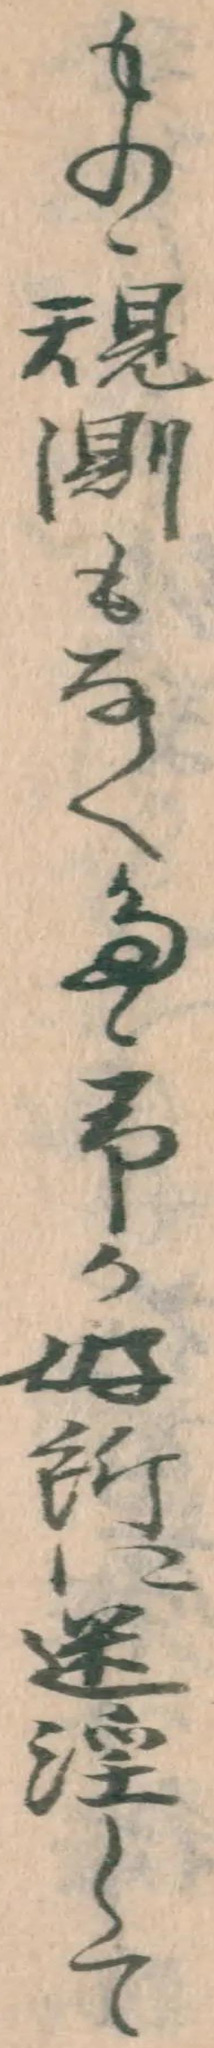ものゝ規測もなくたゝ予か好所に迷淫して
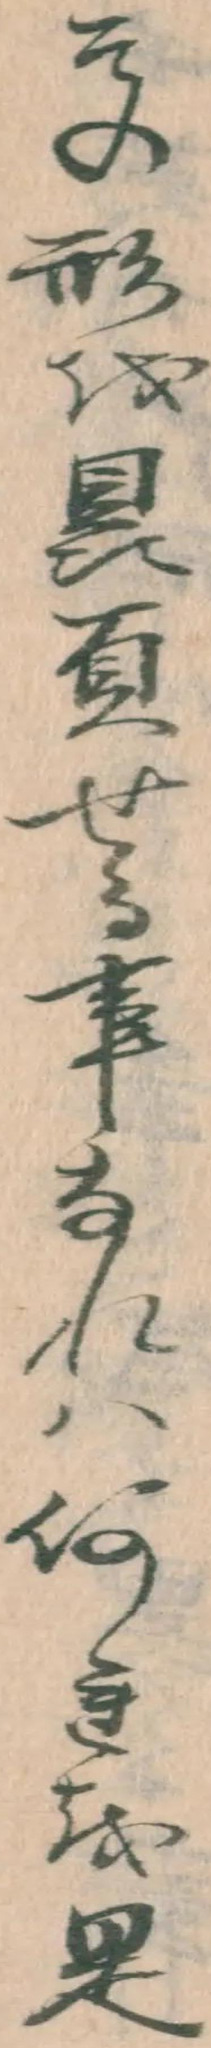その形を具頁せる事なれハ何れを是
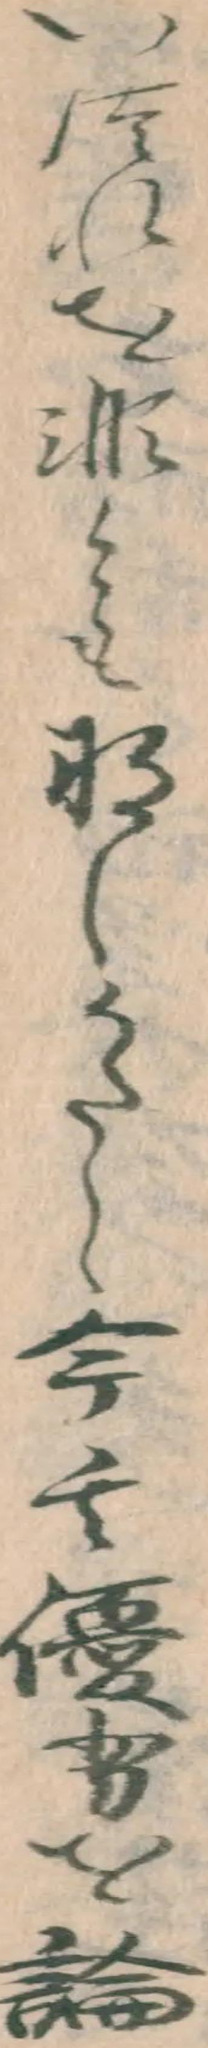いつれを非ともなしかたし今其優劣を論
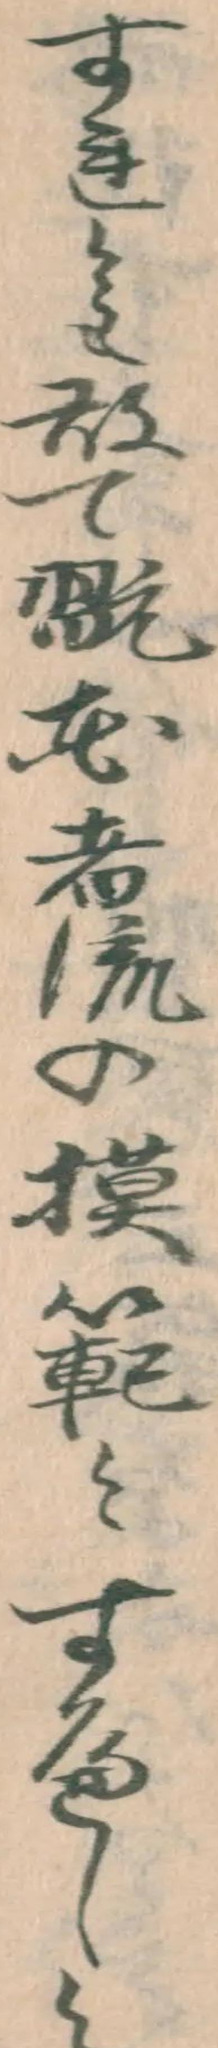すれとも敢て既花者流の模範とすへしと
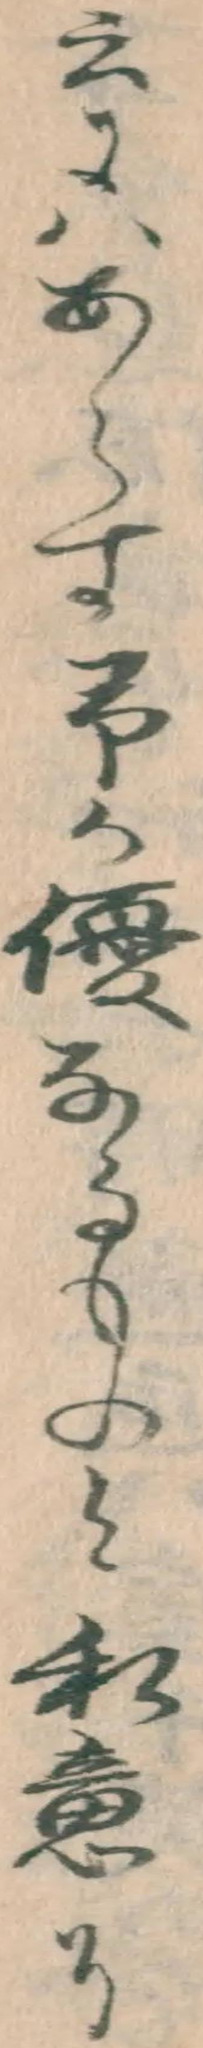云にハあらす予か優なるものと私意に
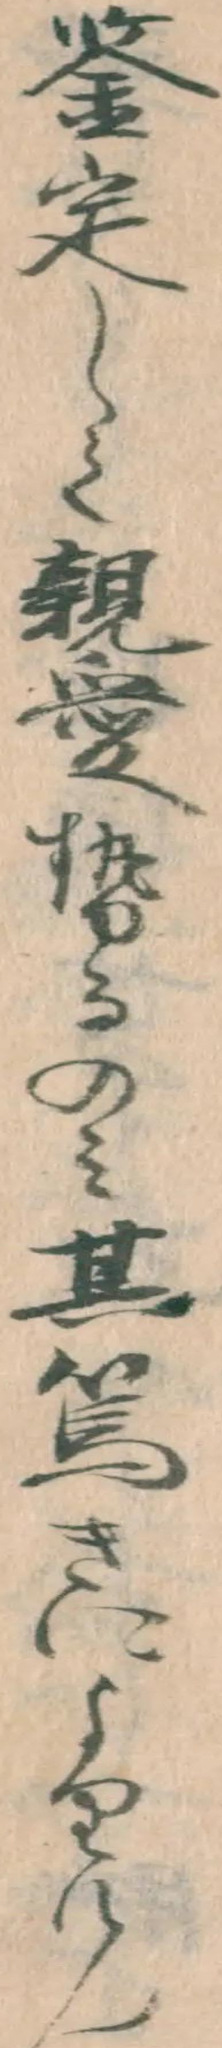筌定して親愛せるのミ其篤きによりけん
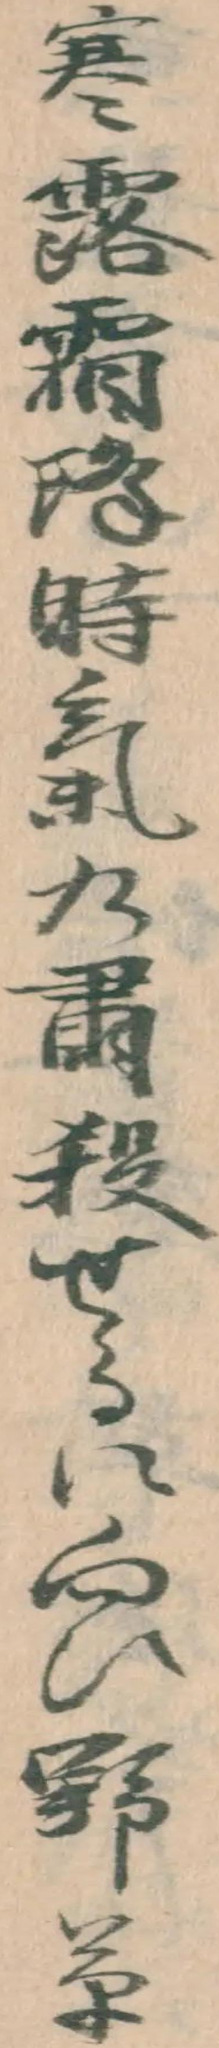寒露霜降時気の粛殺せるに向ひ野草

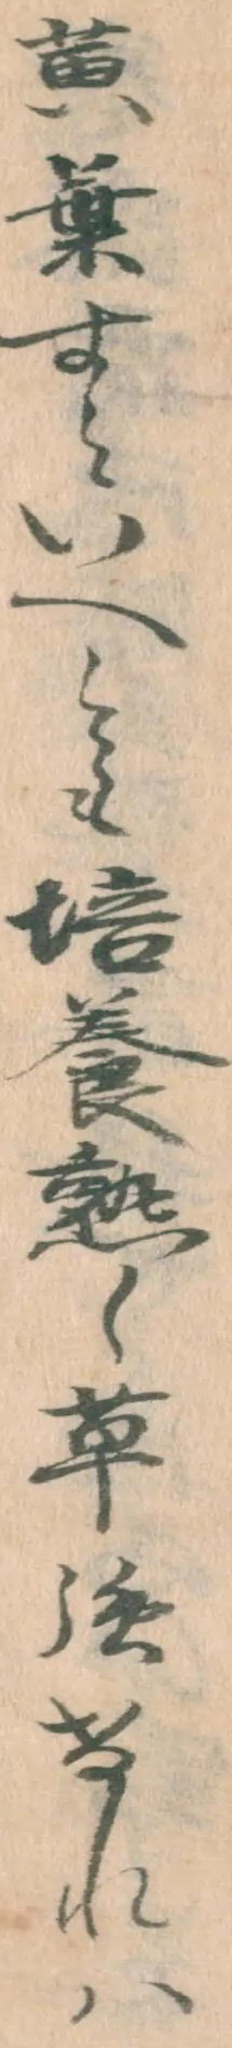黄葉すといへとも培養熟し草強けれハ
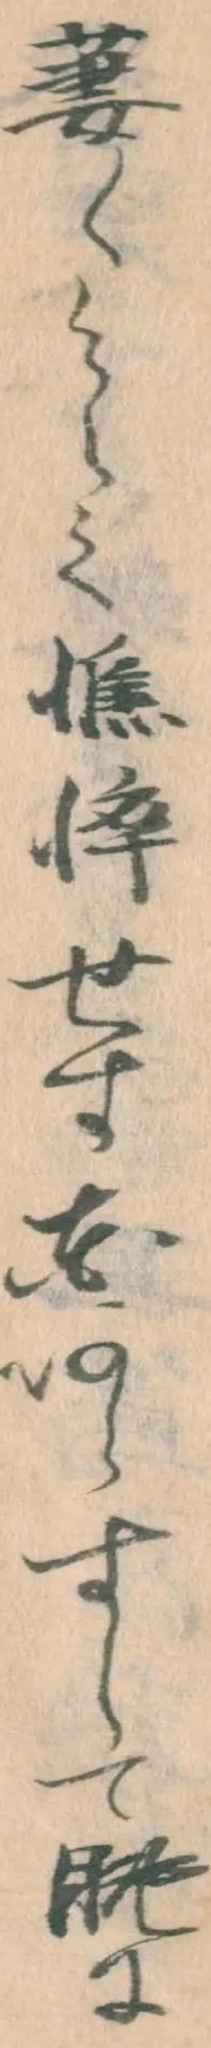萎くとして憔悴せす花あらすして眺に
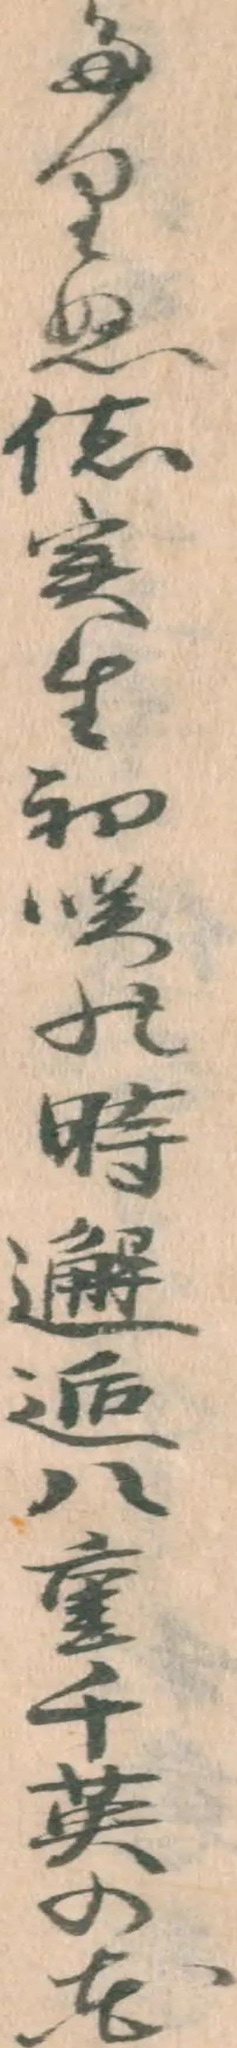たりぬ偖実生初咲の時邂逅八重千英の花
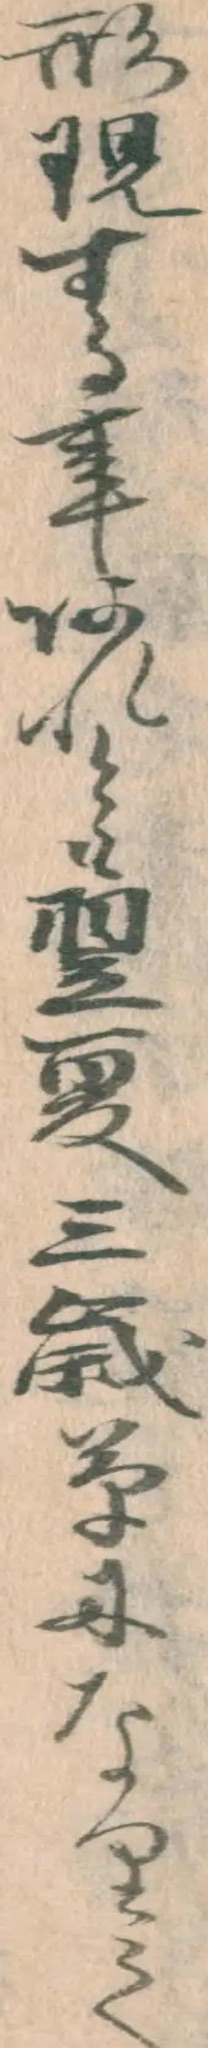形現する事あれとも翌夏三歳草になりて
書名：花菖培養録
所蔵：国立国会図書館 National Diet Library, JAPAN
